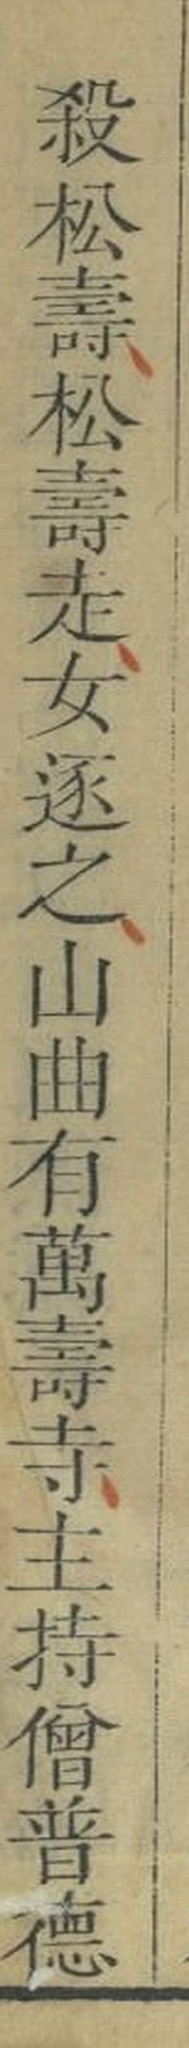殺松壽松壽走女逐之山曲有萬壽寺主持僧普德

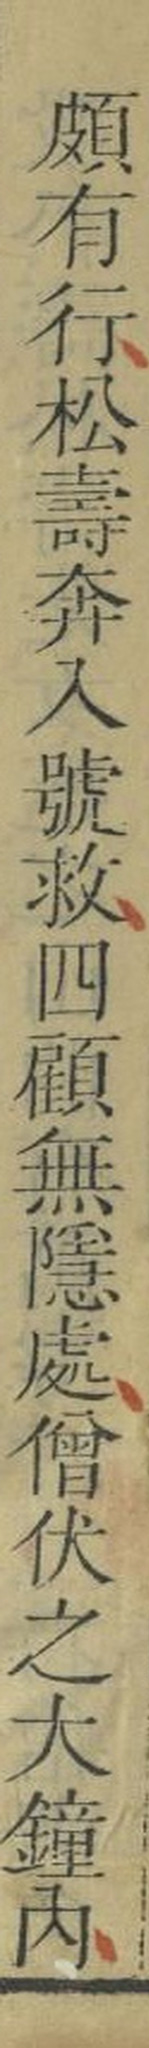頗有行松壽奔入號救四顧無隱處僧伏之大鐘内
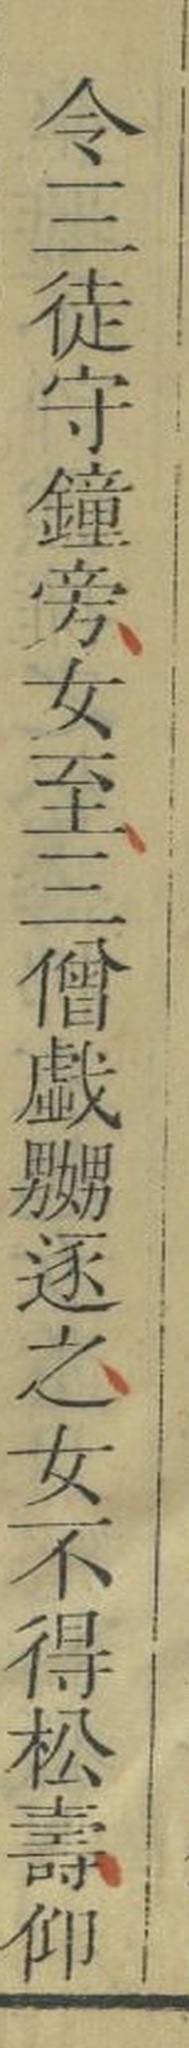令三徒守鐘旁女至三僧戱嬲逐之女不得松壽仰
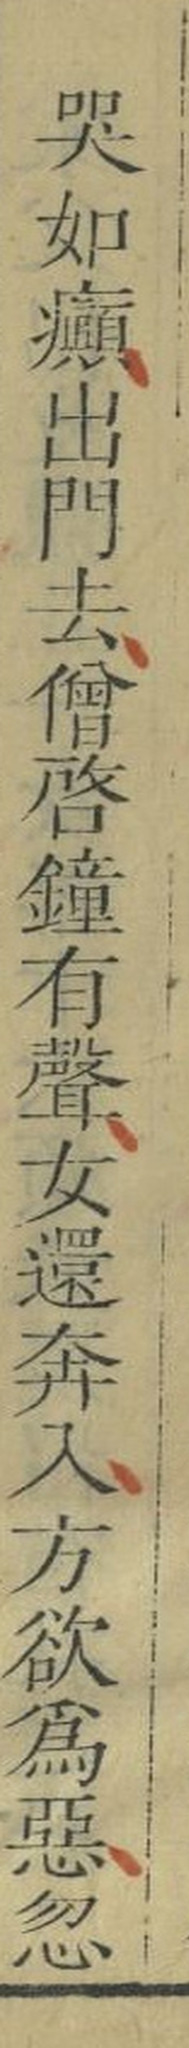哭如癲出門去僧啓鐘有聲女還奔入方欲爲惡忽
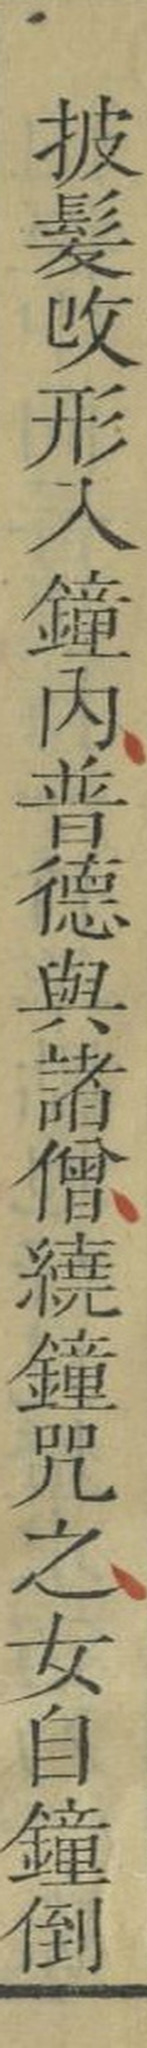披髪攺形入鐘内普德與諸僧繞鐘咒之女自鐘倒
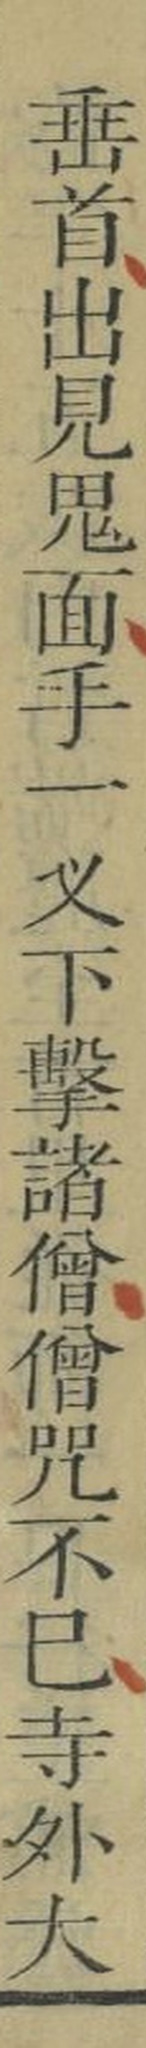垂首出見鬼面手一叉下擊諸僧僧咒不巳寺外大
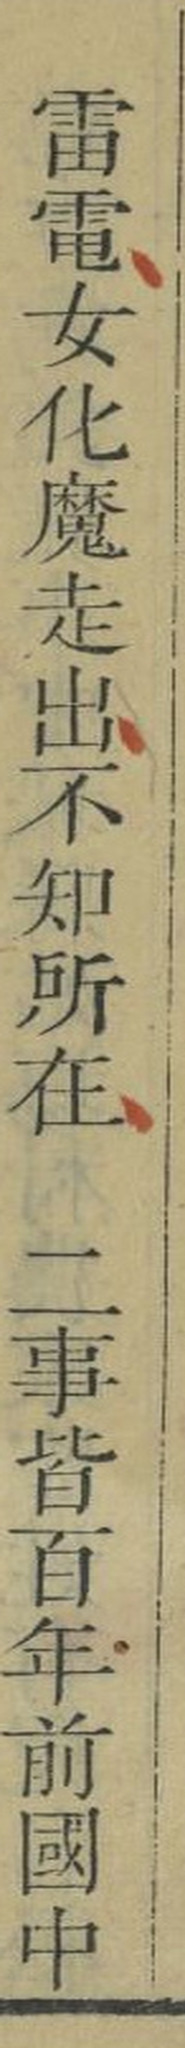雷電女化魔走出不知所在二事皆百年前國中
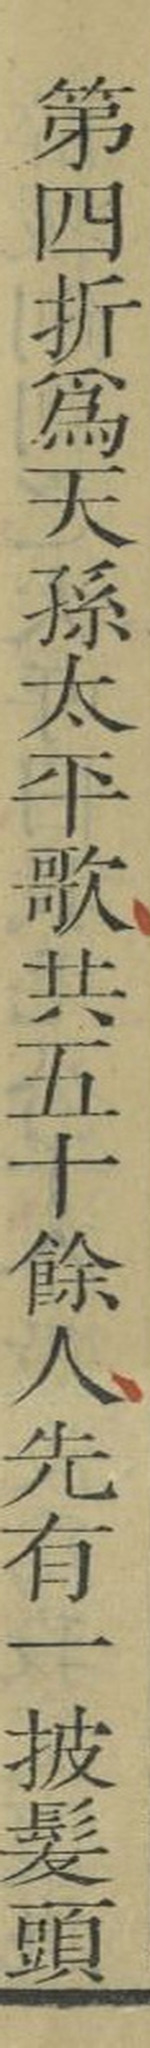第四折爲天孫太平歌共五十餘人先有一披髪頭
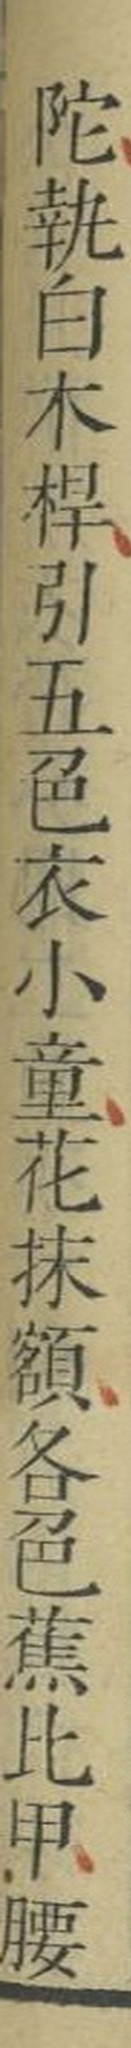陀執白木桿引五色衣小童花抹額各色蕉比甲腰
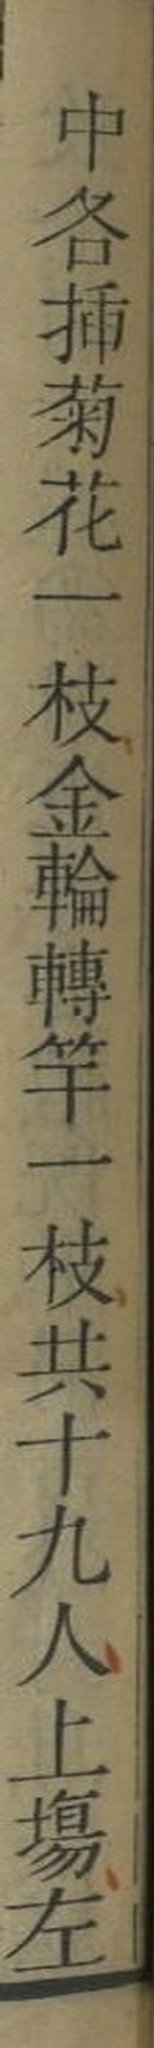中各揷菊花一枝金輪轉竿一枝共十九人上塲左
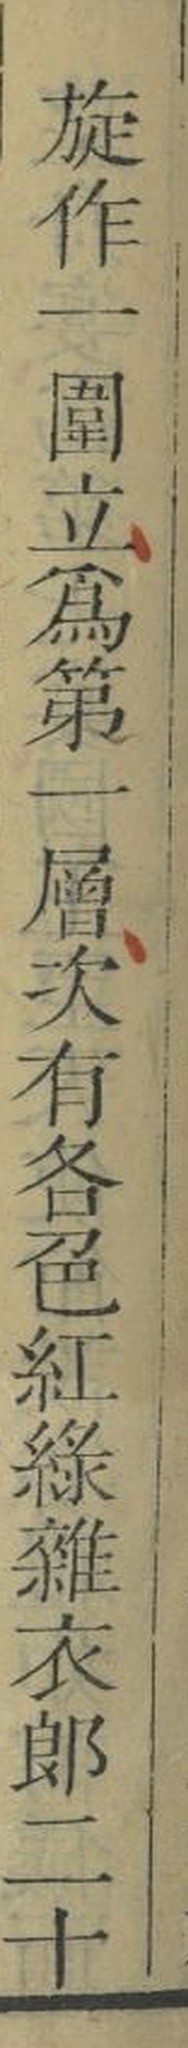旋作一圍立爲第一層次有各色紅綠雜衣郎二十
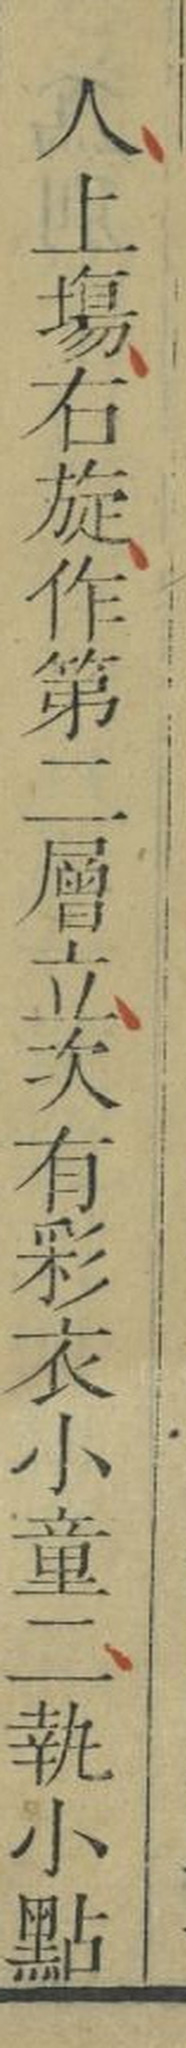人上塲右旋作第二層立次有彩衣小童二執小點
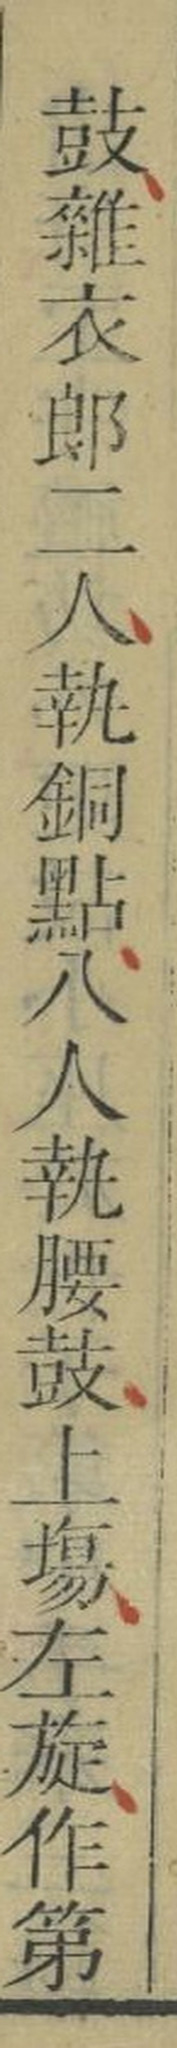鼓雜衣郎二人執銅點八人執腰鼓上塲左旋作第
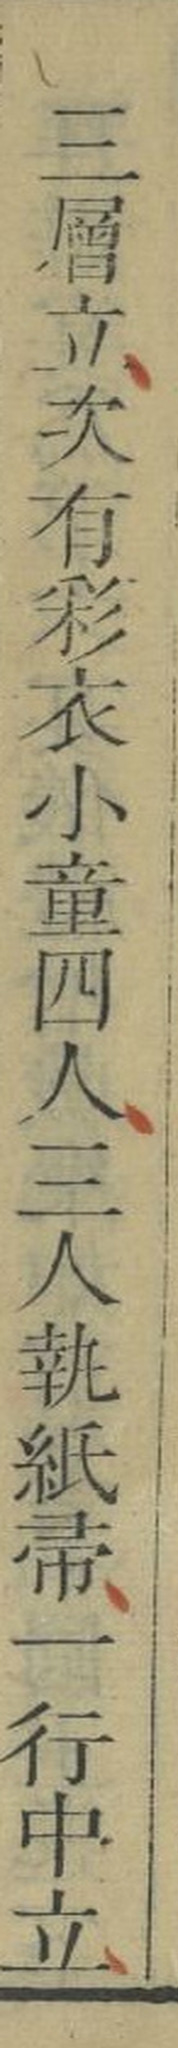三層立次有彩衣小童四人三人執紙帚一行中立
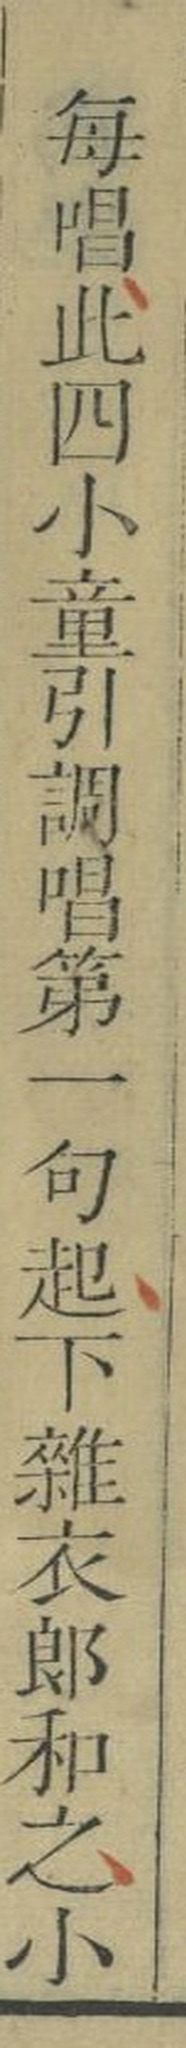每唱此四小童引調唱第一句起下雜衣郎和之小
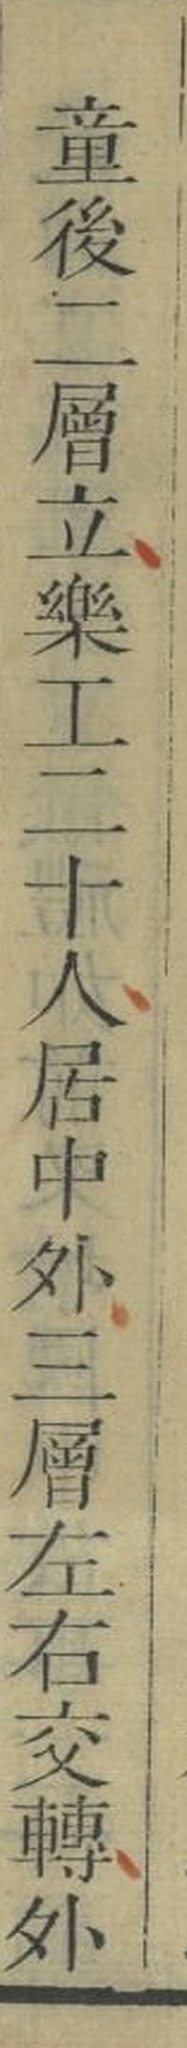童後二層立樂工二十人居中外三層左右交轉外
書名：中山伝信録 巻一、巻二
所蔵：University of the Ryukyus Library
